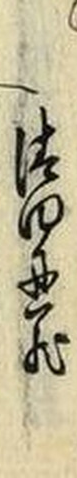清田丹蔵
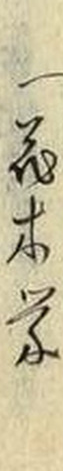花木栄
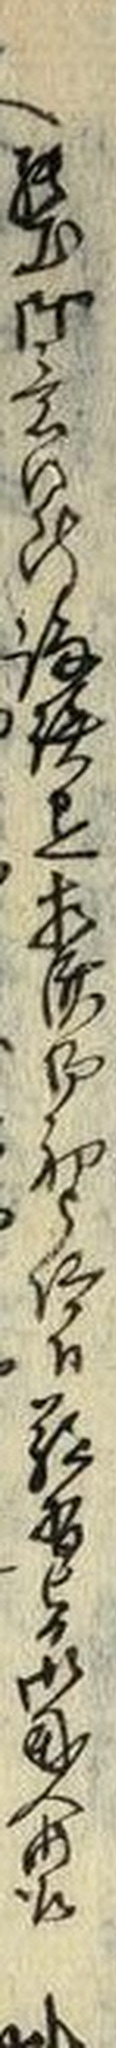罷出御意名夫ゟ講談申上相済御初被仰付難有旨
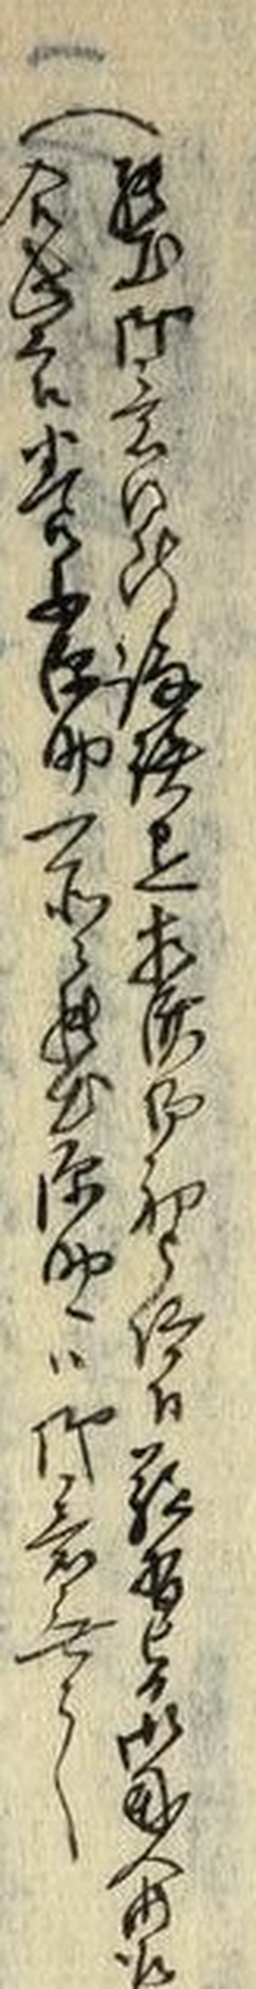合此節養子源介一所ニ罷出源助へハ御意無之
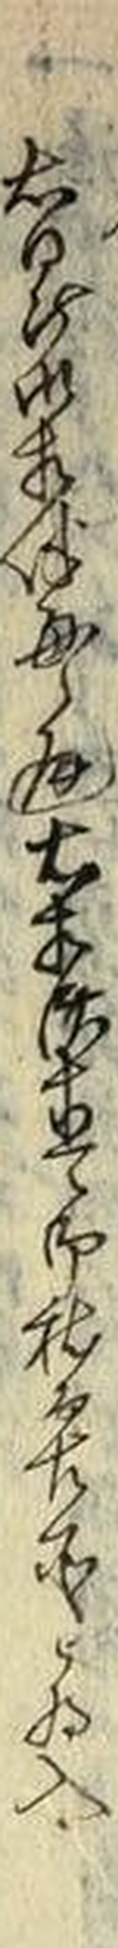右同断御相伴毎之通右相済直ニ御稽古所へ被為入候
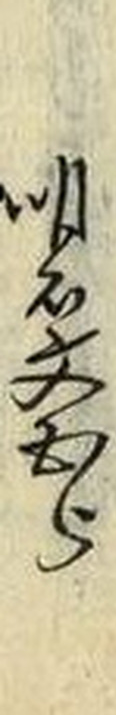明石文五郎
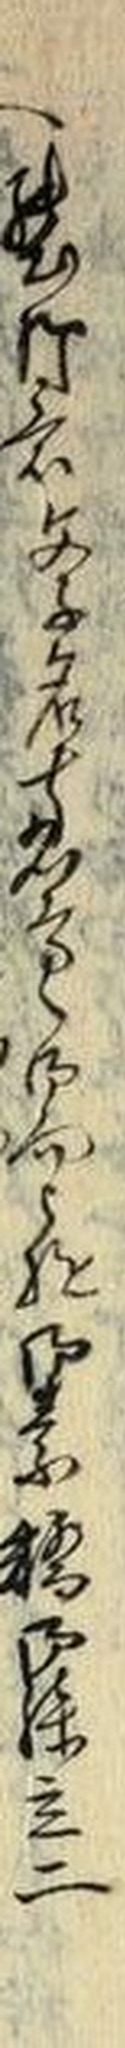罷出御意父子名恵方へ御向被遊御素矯御膝立二
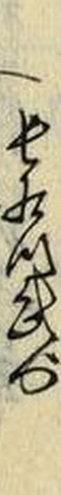長谷川武右衛門
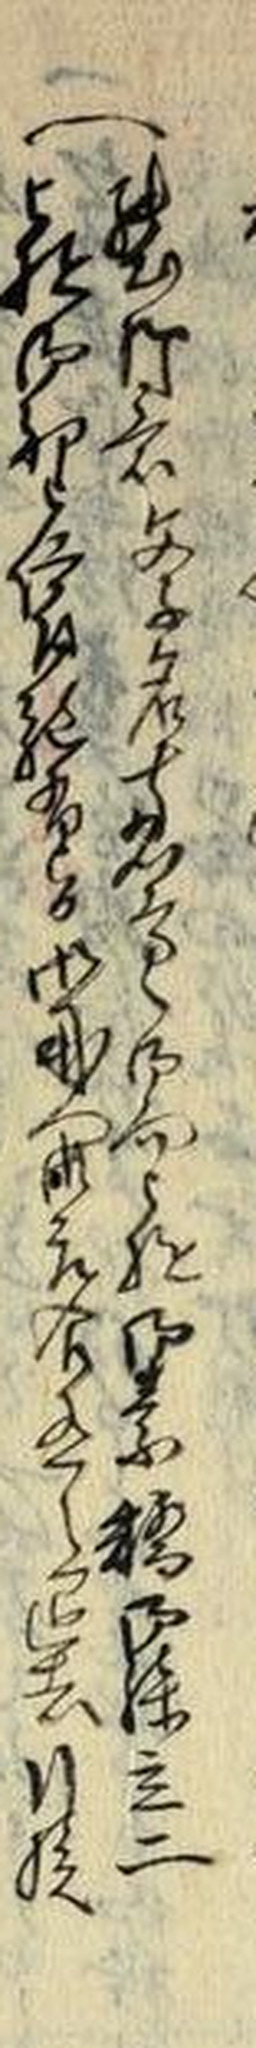被遊御初被仰付難有旨御用人御取合有之退去引続
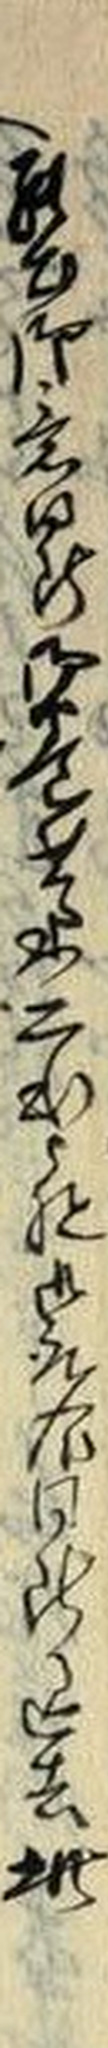罷出御意同断御巻藁二本被遊御取合同断退去此
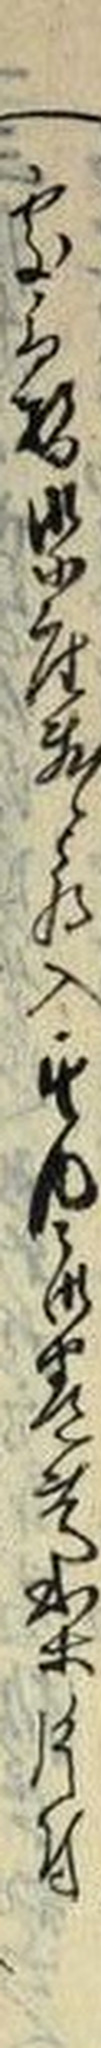処ニ而暫御小座敷へ被為入其内之御巻藁等片付
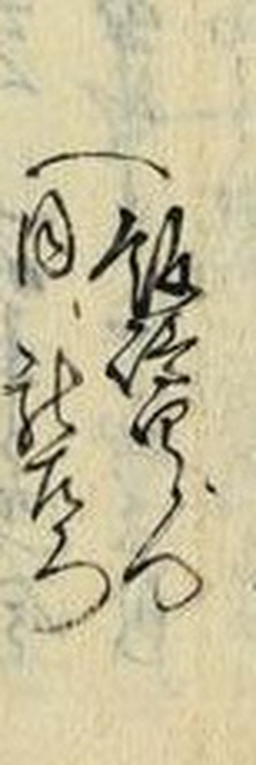同新左衛門
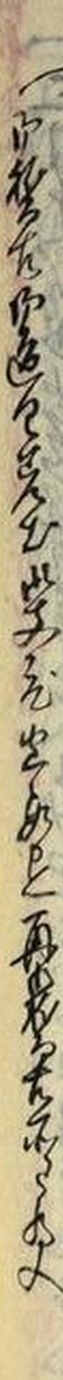御稽古御道具差出御支度宣段申上再御稽古所へ被為入
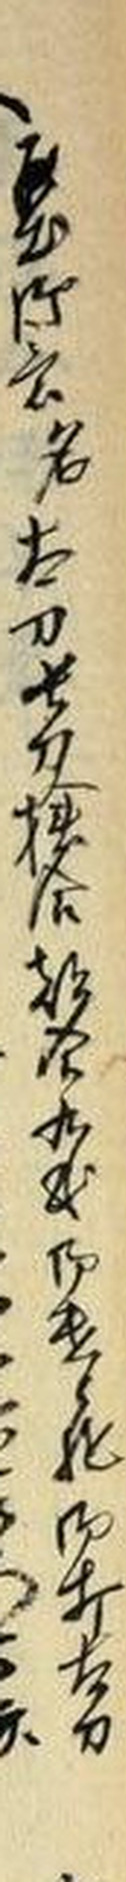罷出御意名太刀長刀槍合都合九本御遣被遊御打太刀
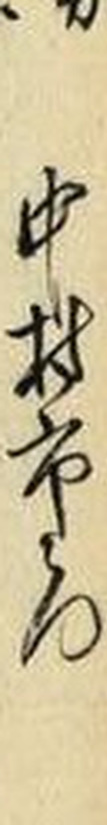中村市右衛門
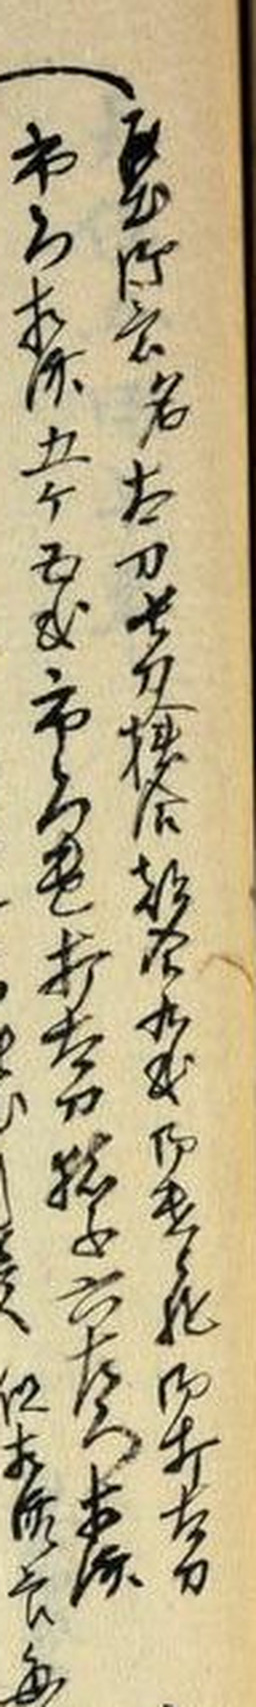市右衛門相済五ヶ五本市右衛門遣打太刀猪子六左衛門相済
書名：少傅日録抄（斉承付側向頭取日記、在国）
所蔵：福井県文書館 Fukui Prefectural Archives
